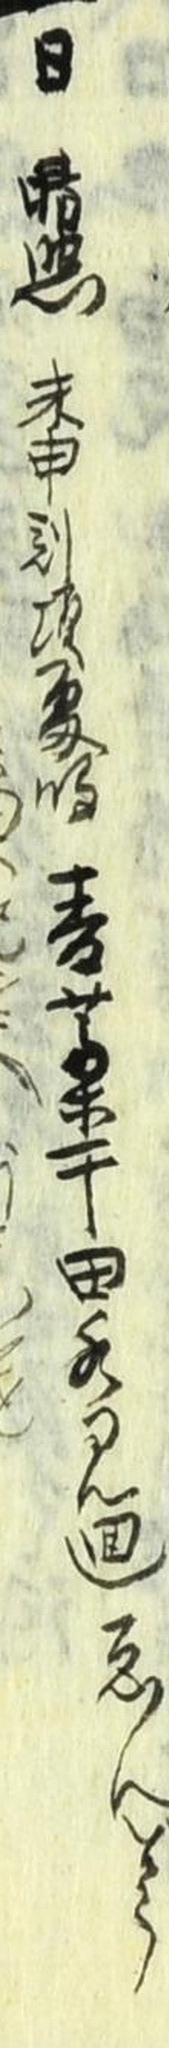五日晴照未申刻頃雷鳴麦藁干田水見廻ゑんどう
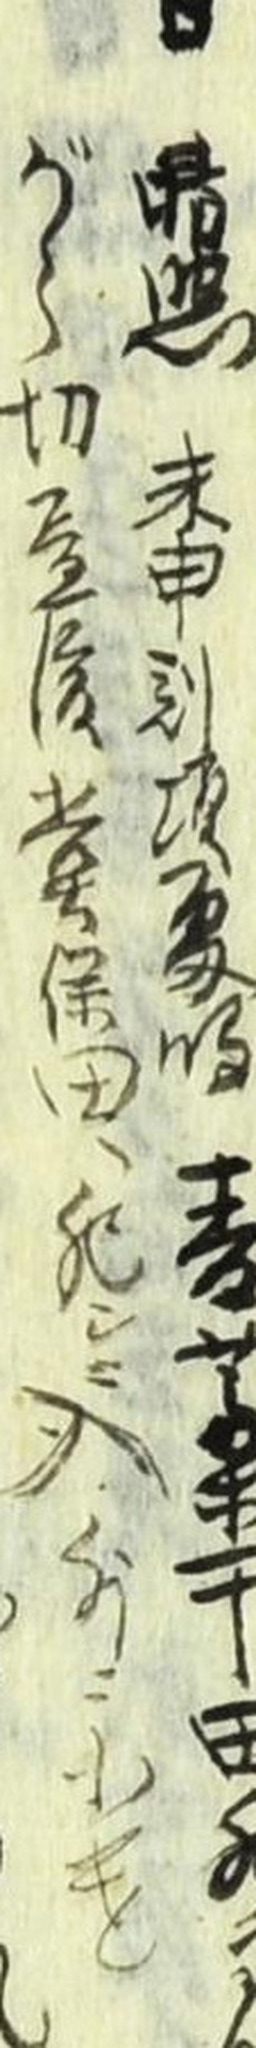がら切昼後堂保田へ肥シニ入外ニ小遣
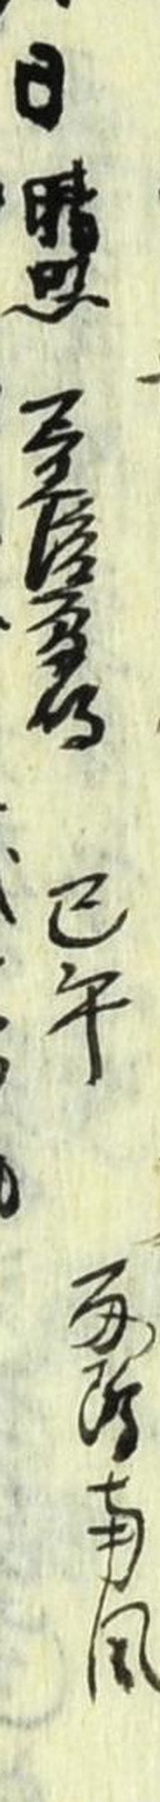六日晴照昼後雷鳴已午雨降南風
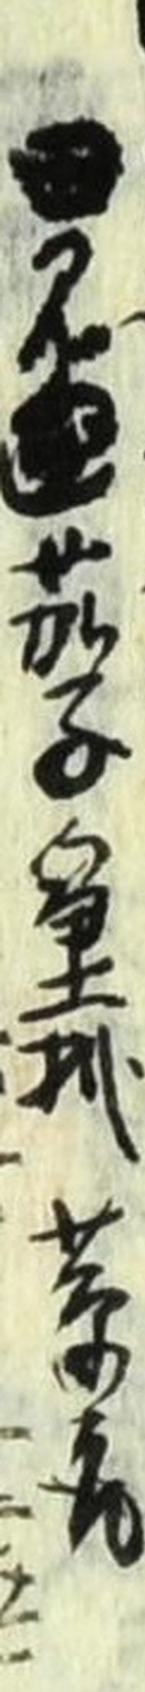田見廻茄子畠土掛草取
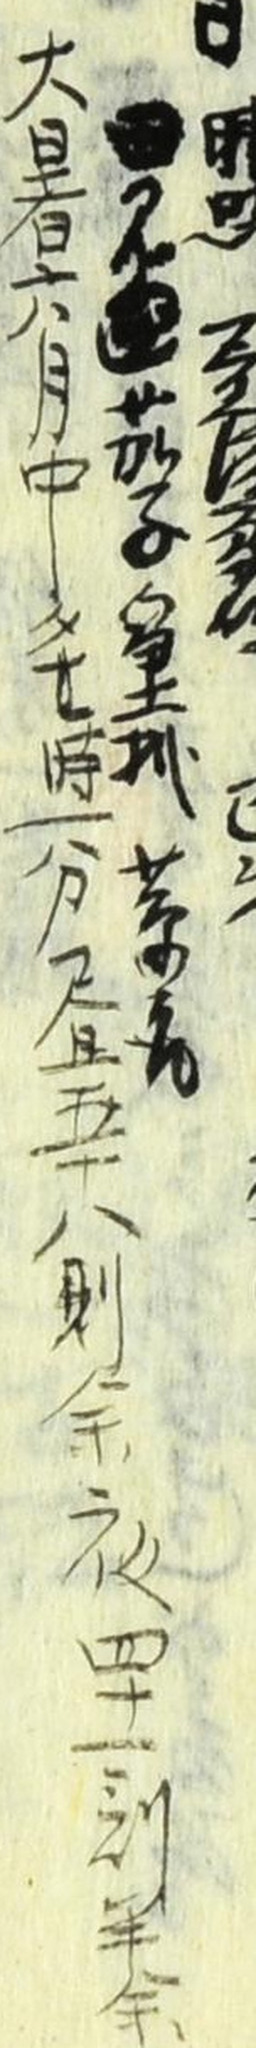大暑六月中夕七時一分昼五十八刻余夜四十一刻半余
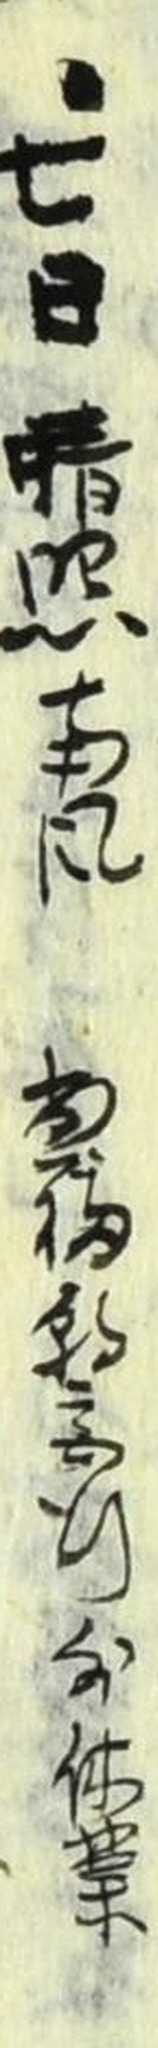●七日晴照南風出福朝宮行外休業
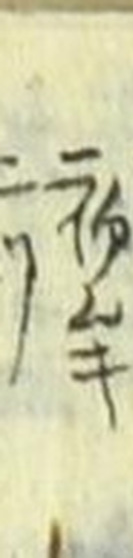二ツ」
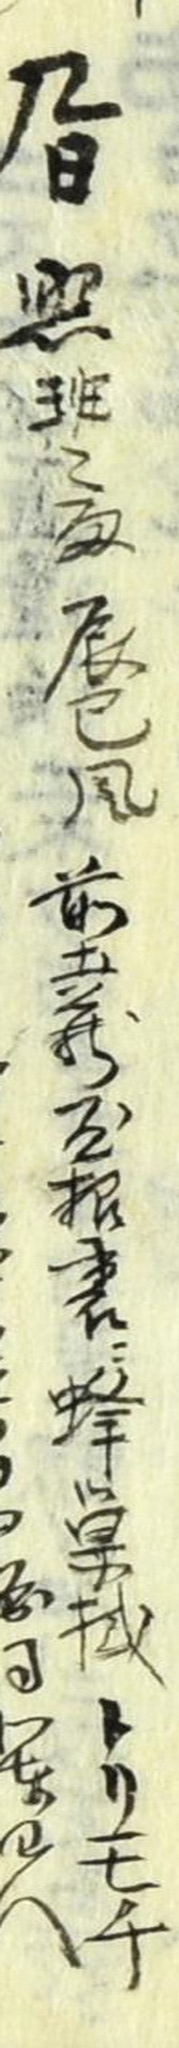九日照班々雨辰巳風前土蔵屋根裏ニ蜂巣拭トリモチ
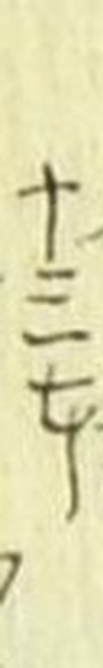十三本
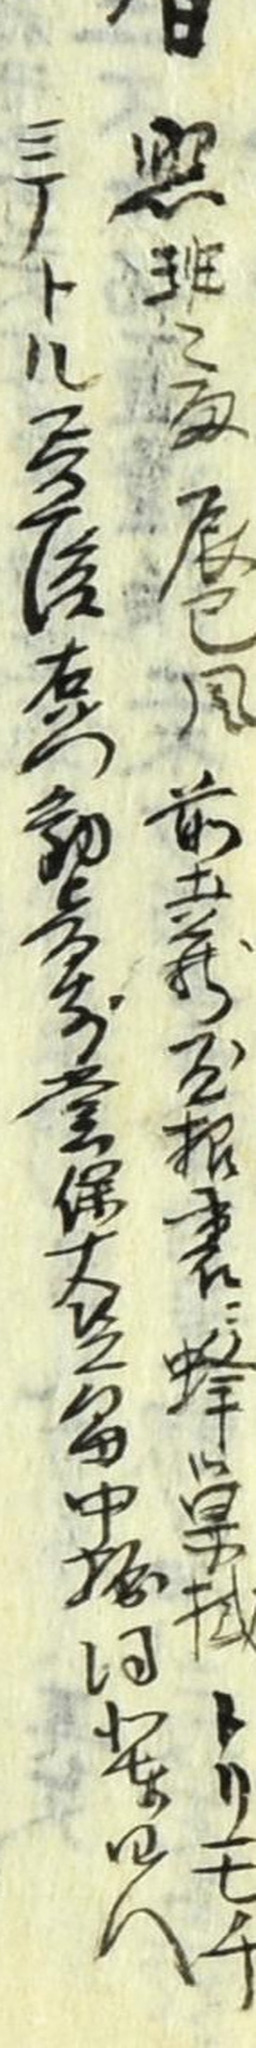ニテトル昼後右衛門勧音前堂保大豆畠中堀同輩四人
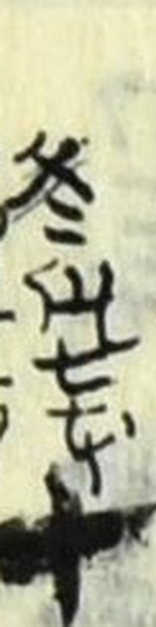「冬瓜七本
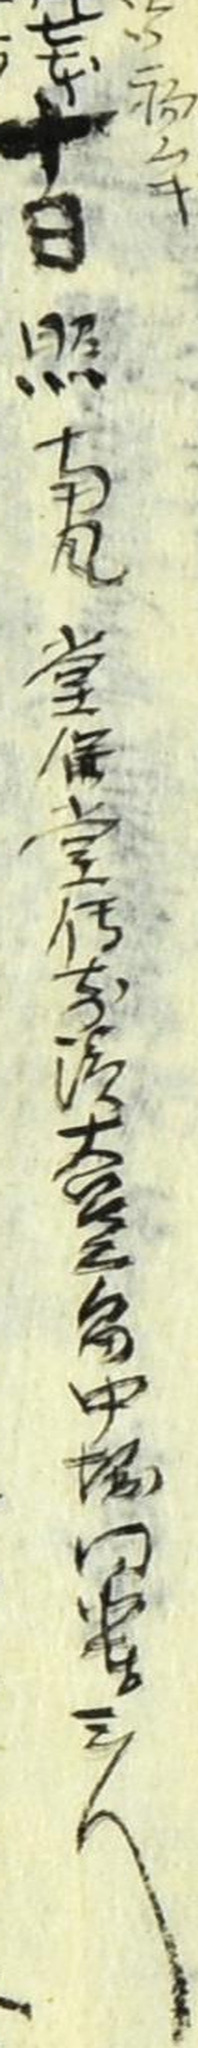十日照南風堂保堂伝前浜大豆畠中堀同輩三人
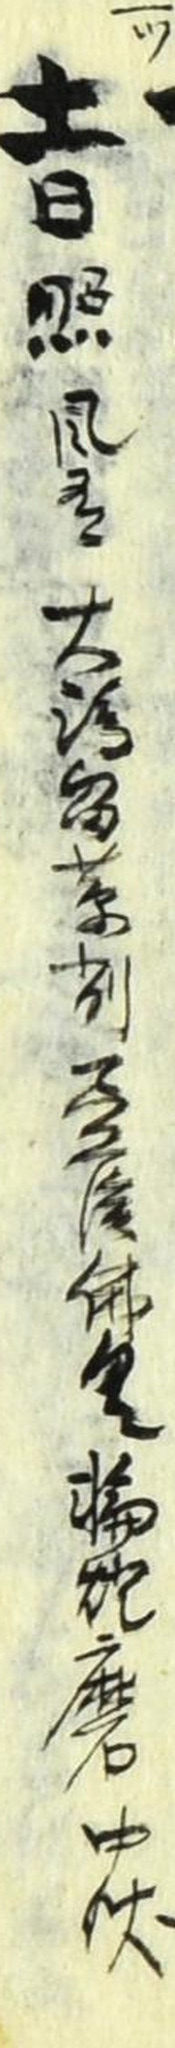十一日照風有大島畠草削昼後仏具輪燈磨中伏

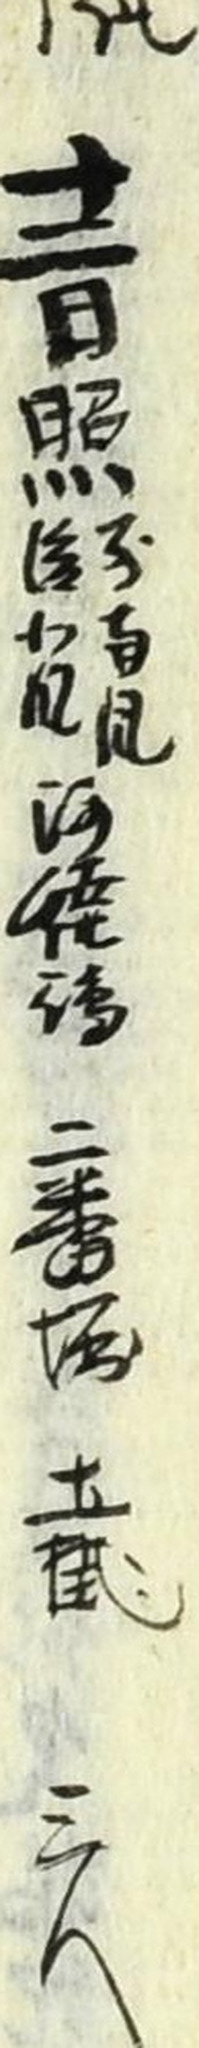十二日照前南風後北風河饒島二番堀土掛三人
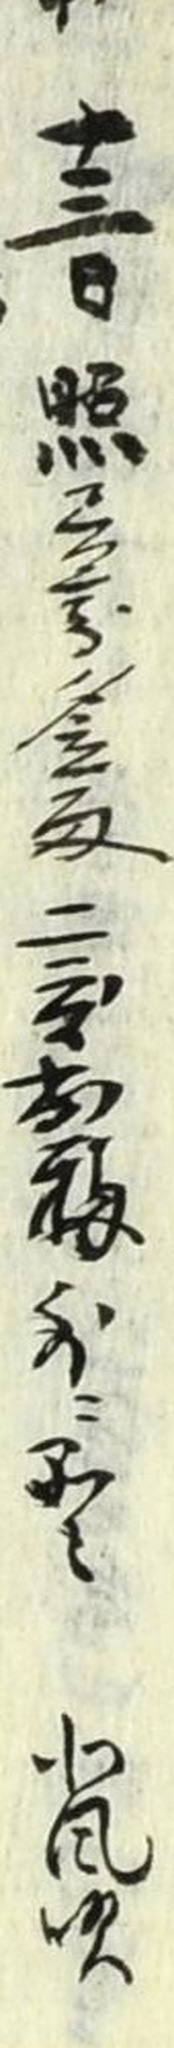十三日照昼前夕立雨二度出福外ニ所々北風吹
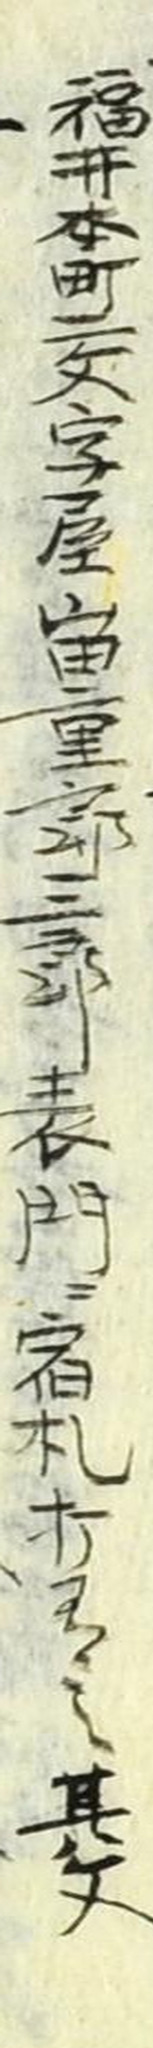福井本町二文字屋山田重郎三郎表門ニ宿札打有之其文
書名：（日記）
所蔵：福井県文書館 Fukui Prefectural Archives
